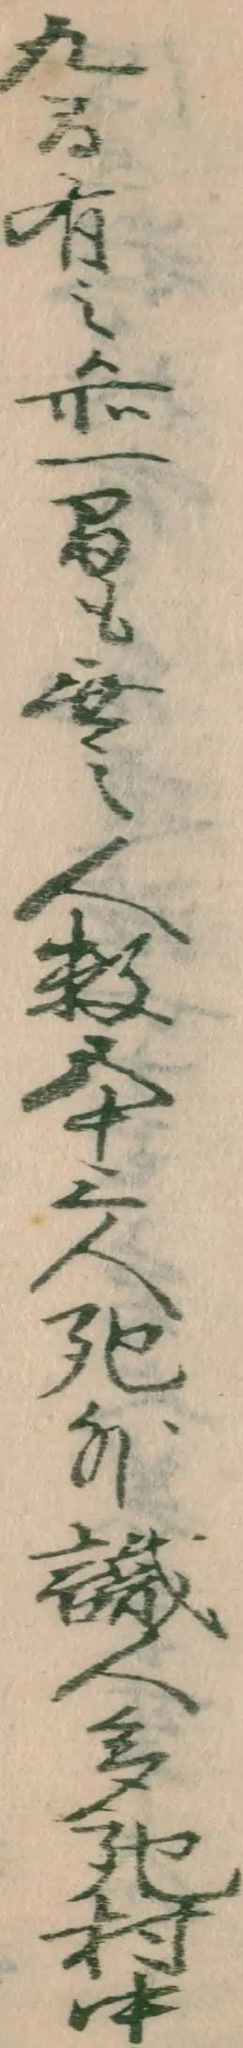九間有之候所一間も無之人数五十三人死外識人多死村中
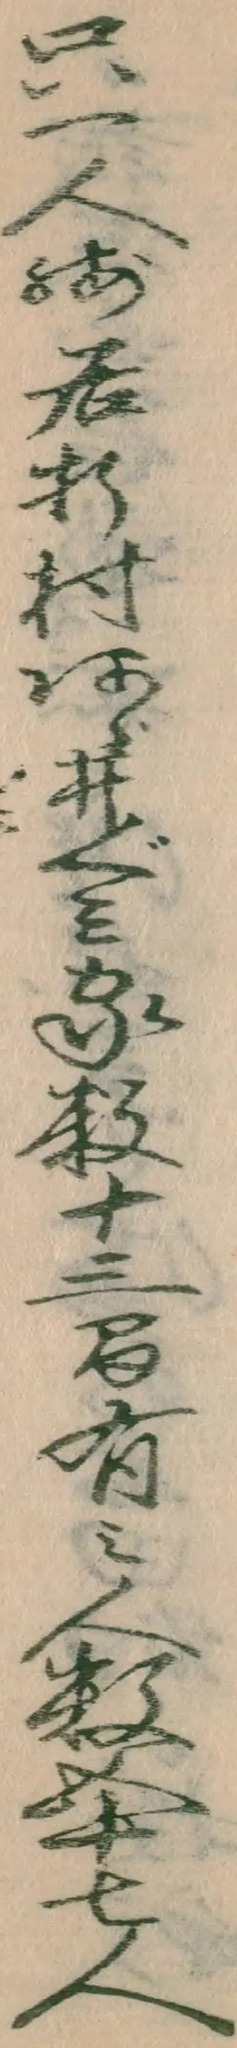只一人残居折村あら井ぐミ家数十三間有之人数五十七人
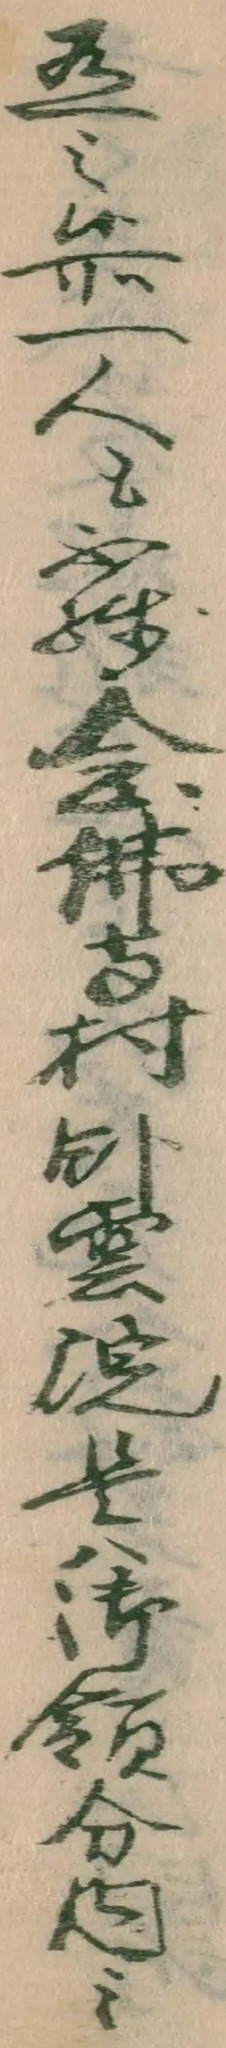有之候所一人も不残念仏寺村臥雲院是は御領分内之
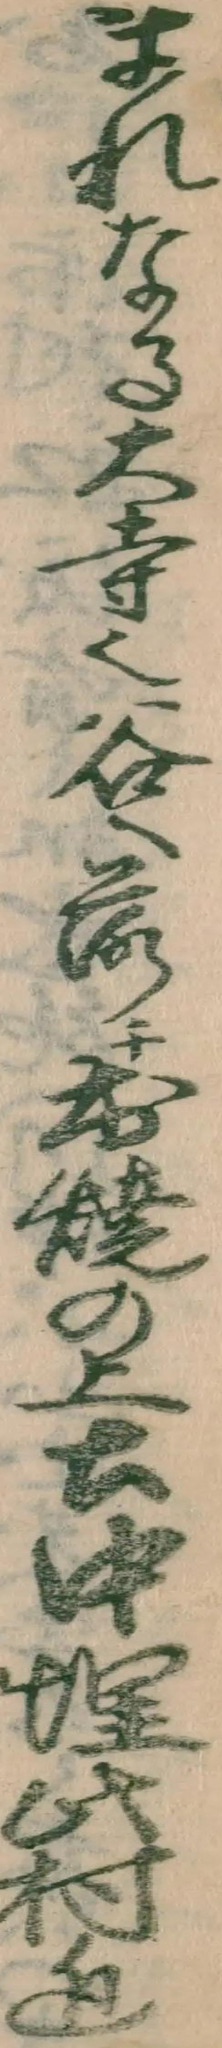まれなる大寺也谷へ落チ出焼の上土中埋此村近
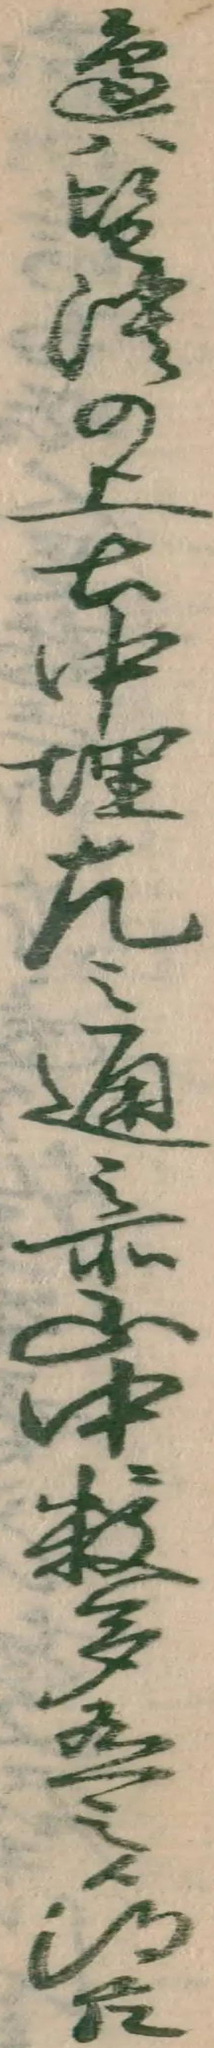辺は皆潰の上土中埋左之通之所山中ニ数多有之候得共
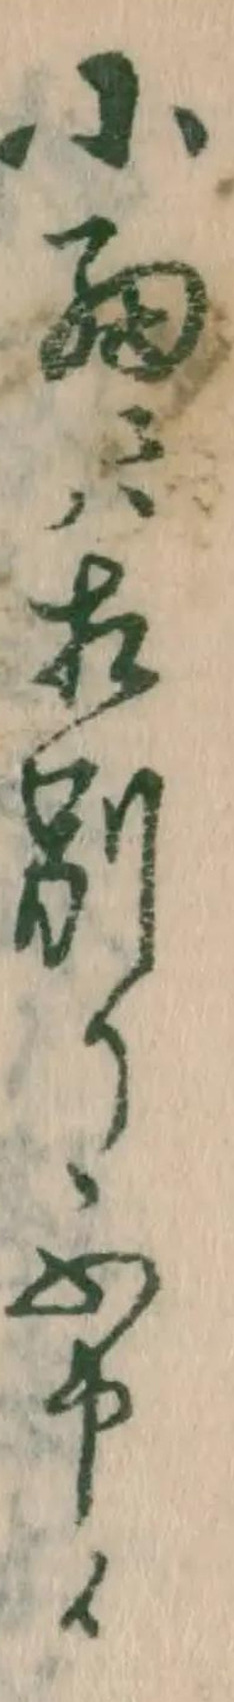小雨ニは相別り不申候
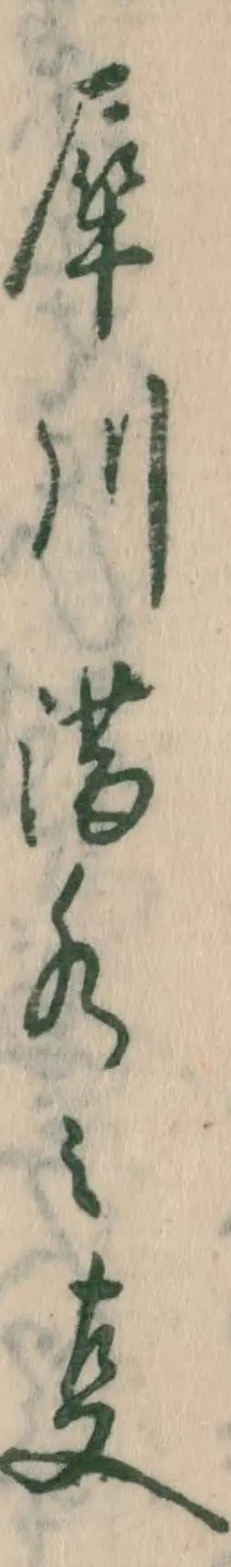犀川潜水之事
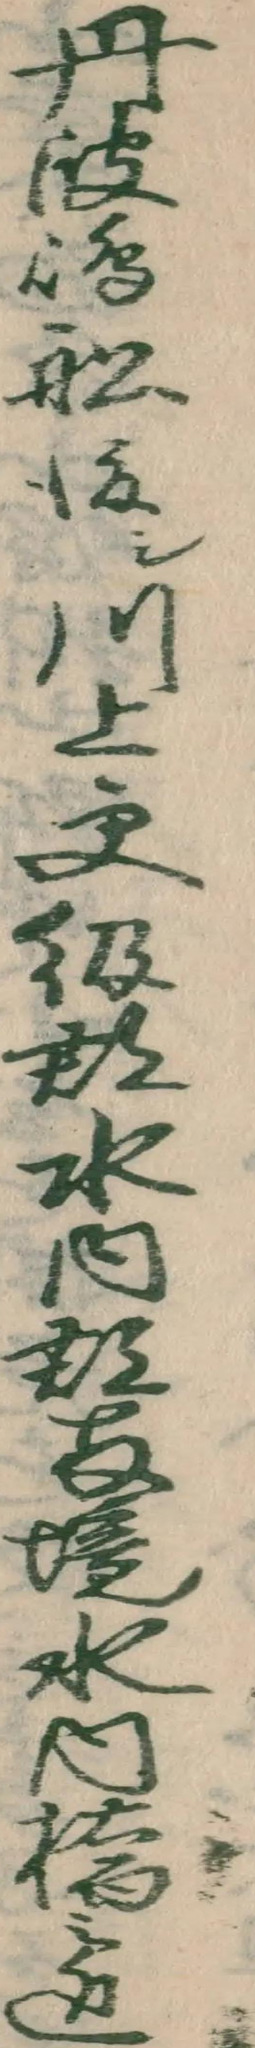丹波嶋船渡シ川上更級郡水内郡両境水内橋之近
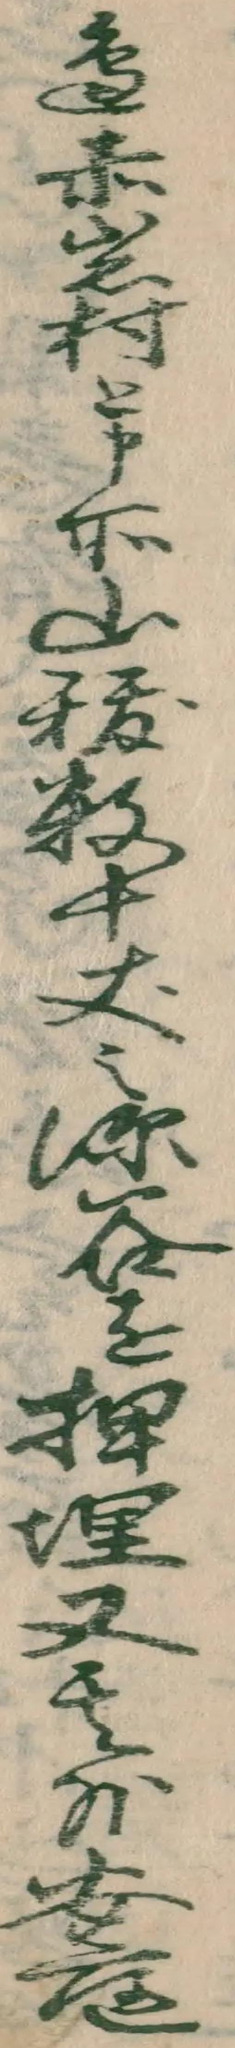辺赤岩村と申所山抜数十丈之深谷を押埋又其外安庭
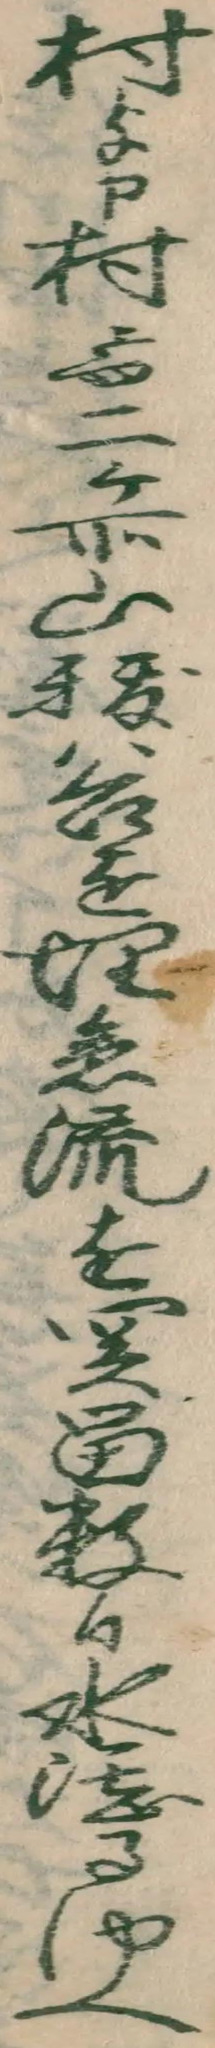村と申村ニ而二ケ所山抜谷を埋急流を関留数日水湛るゆへ
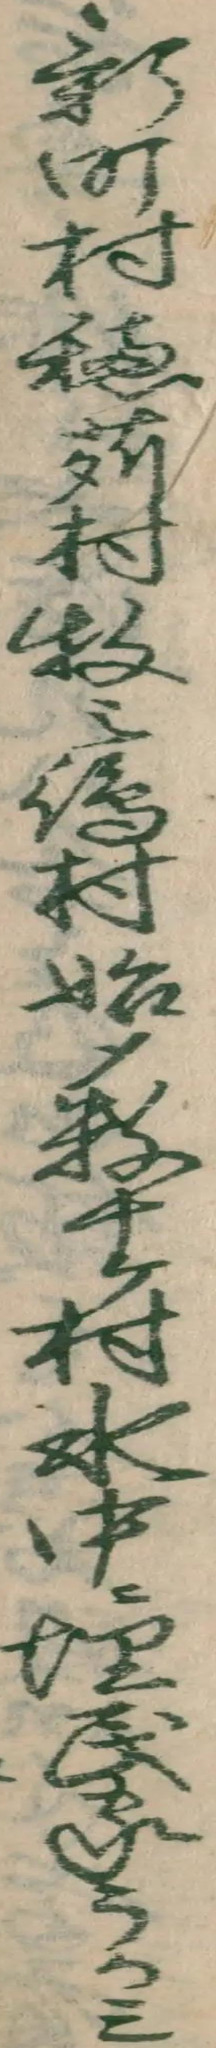新町村穂苅村牧之嶋村始メ数十ケ村水中ニ埋民家うかミ

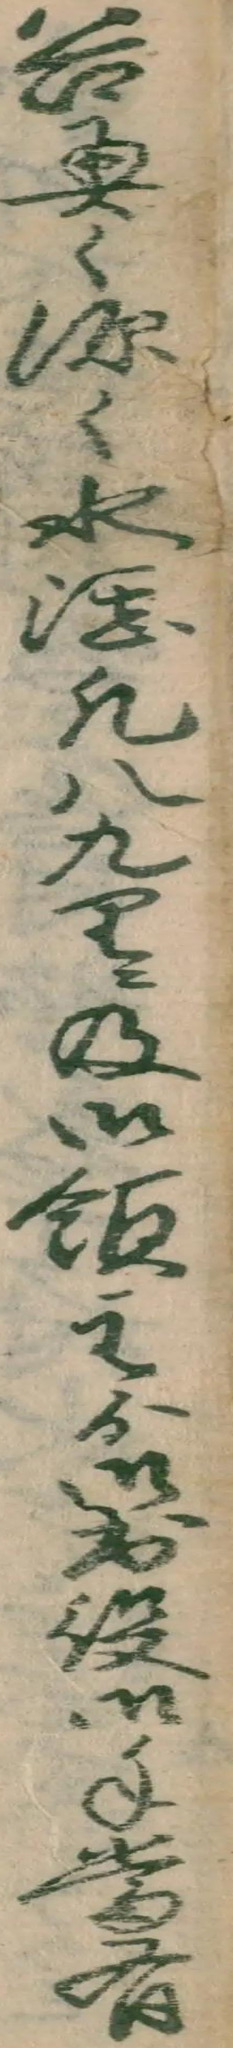谷奥く深く水湛凡八九里ニ及御領主ゟ御出役御手当有
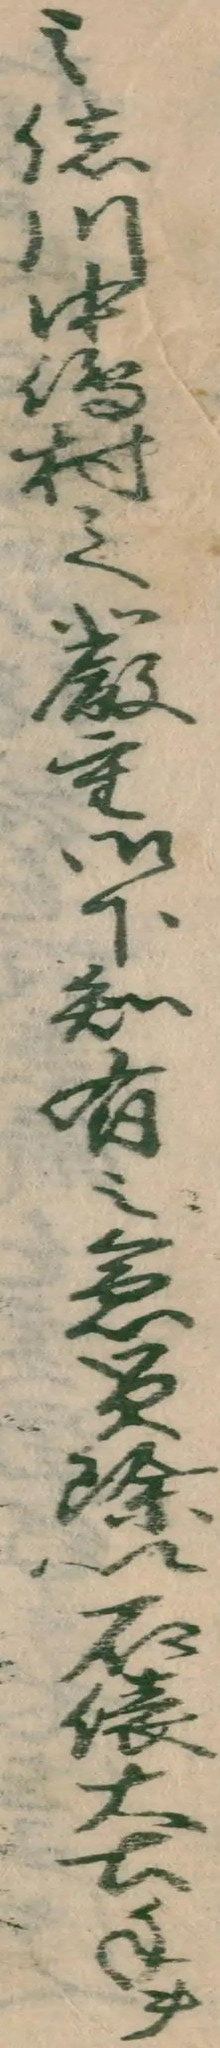之偖川中嶋村之厳重御下知有之急災除以石俵大土手ヲ
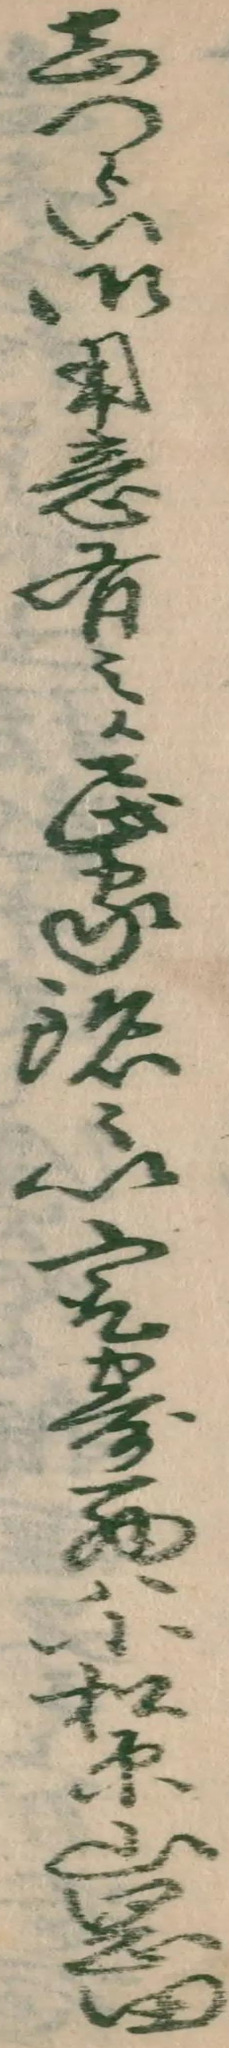しつらい御用意有之候民家銘〻以最寄西は小松原山岡田
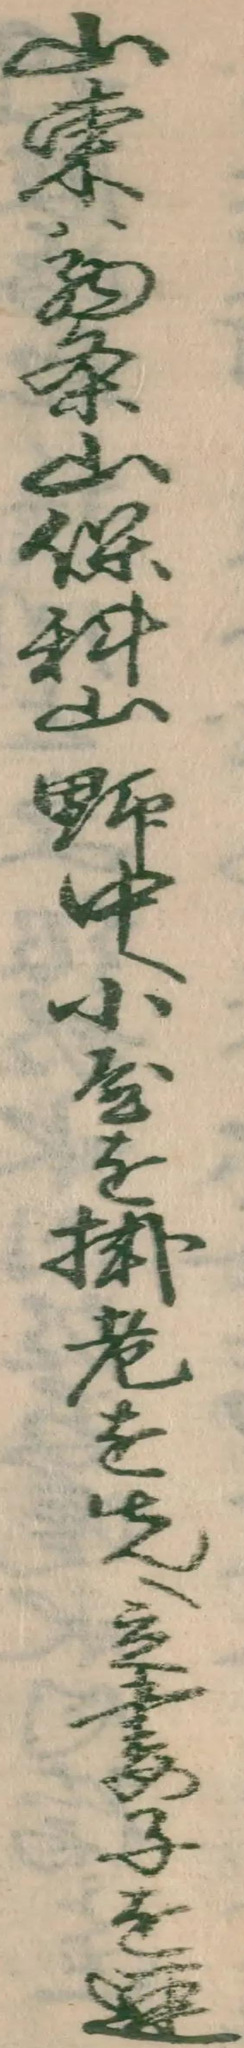山東は西条山保科山野中へ小屋を掛老を先へ立妻子を連
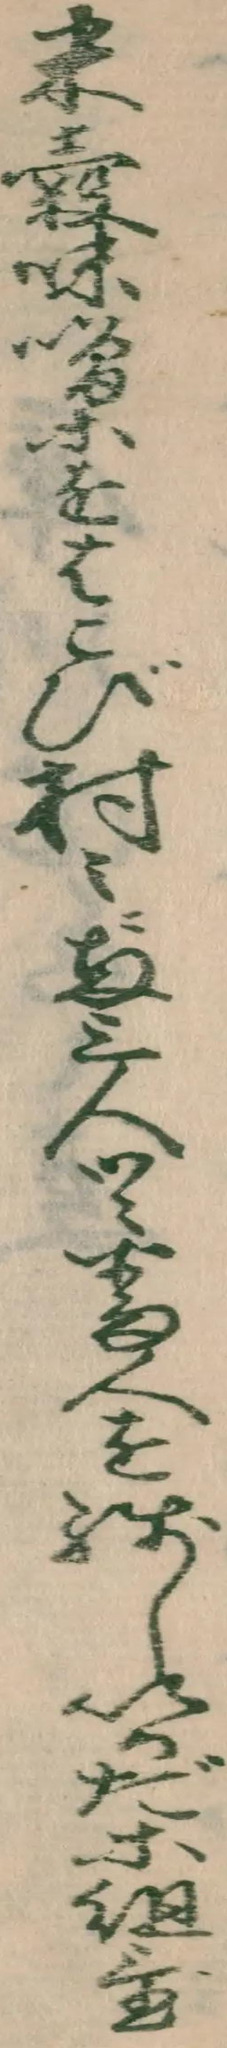米穀味噌等をはこび村〻ニ両三人ツヽ番人を残しいかだ等組置
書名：大地震
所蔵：国立国会図書館 National Diet Library, JAPAN
